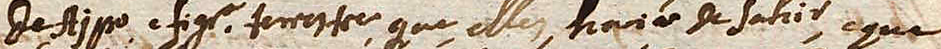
de Aipo e figr.a terrestre, que, elles, haviaõ de sahir, e que
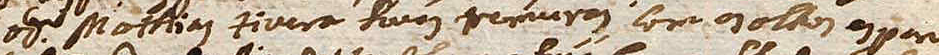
o d.to Mathias tivera huās tremeiras com os olhos espan
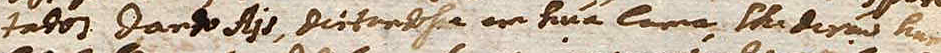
tados dando Ais, deitandosse em humā cama lhe derão hum
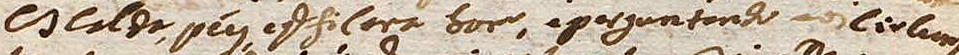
escalda, pées, e q̄ ficara bom, e perguntando aos circuns
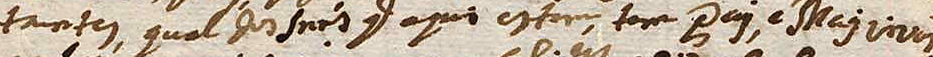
tantes, qual dos snr̄.s q̄ aqui estam, tem paj e Maj vivos
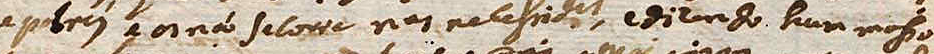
e pobres e os naõ se conta nas necessid.es, e dizendo hum mosso
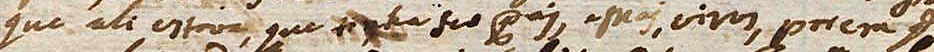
que ali estava, que se acha seo paj, a maj, vivos, porem q̄
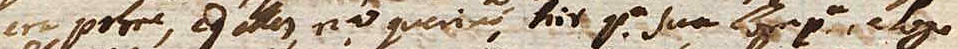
era pobre, e q̄ elles não queriaõ hir p.a sua Comp.a, e logo
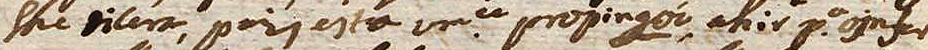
lhe dicera, pois esta v m.ce propinsoz, a hir p.a o infer
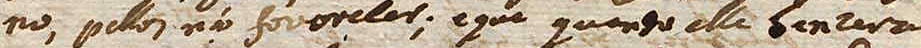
no, pellos não favorecer; e que quando elle benzera
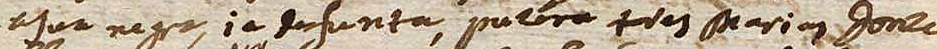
a sua negra, ia defunta, puzera tres Marias donze
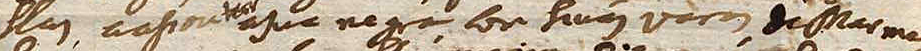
llas, a assoutar a sua negra con huās varas de Marme
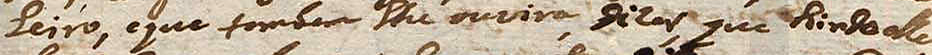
leiro, e que tambem lhe ouvira dizer que hindo elle
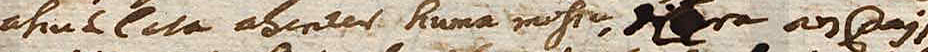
a huā Casa a benzer huma móssa, diCera aos pais,
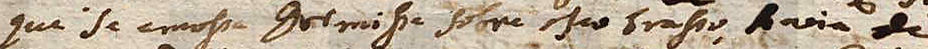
que se a mossa dormisse sobre o seo brasso, havia de
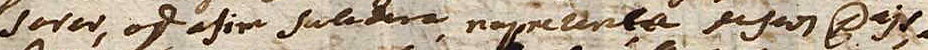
sarar, o q̄ asim sucedera na prezença de seos Pajs, e
